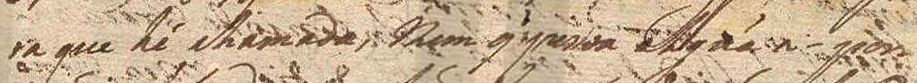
ra que hé chamada, nem q̄ pessoa alguā. a - per
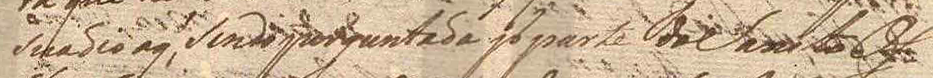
suadio a q̄ sendo perguntada p̄ parte do Sancto Of
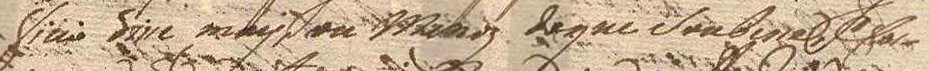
ficio disse mais, ou Menoz do que soubesse, E fos
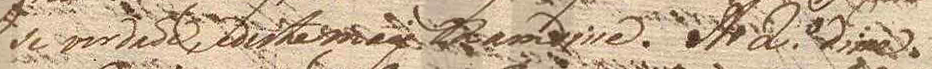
se verdade, e deste mais Nam disse. Ao 2.o disse
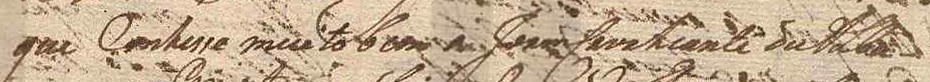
que Conhesse muito bem a Joam Cavalcante de Albu
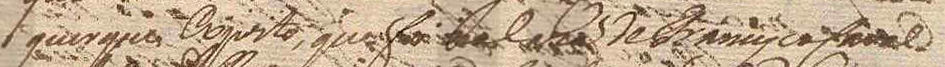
querque Exposto, que foi na Caza de Francisco Caval
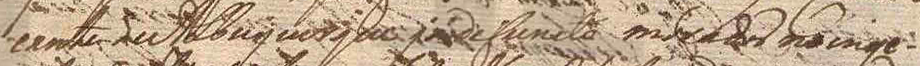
cante de Albuquerque ja defuncto morador no inge
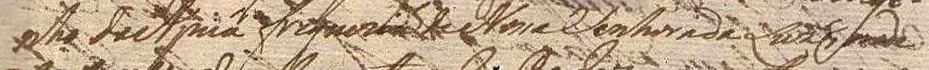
nho do Apuá freguezia de Nossa Senhora da Luz, onde
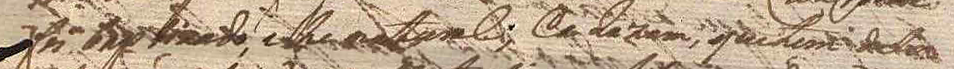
foi baptizado, e he natural; E a Razam, que tem de Co
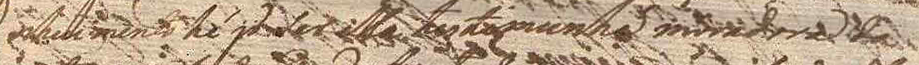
nhecimento hé p̄ ser ella testemunha moradora da
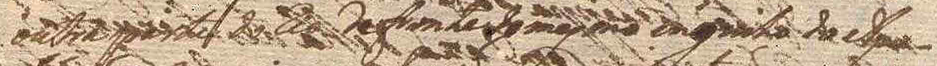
outra parte do Rio defronte do mesmo engenho de Apu
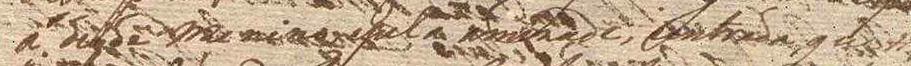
á desde menina pela amizade, e entrada, que ti
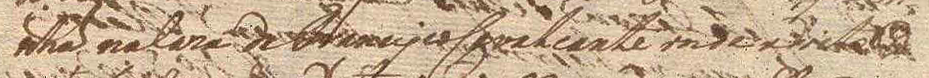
nha na Caza de Francisco Cavalcante onde o dicto de
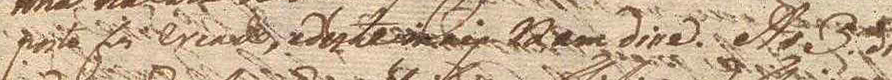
posto foi Criado, e deste mais Nam disse. Ao 3.o di
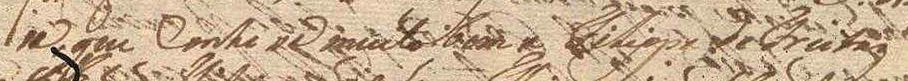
se que Conhesse muito bem a Filippe de Freitaz
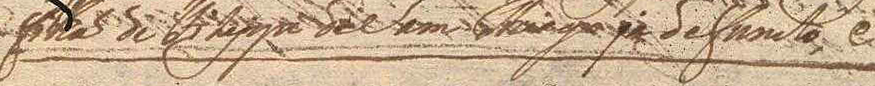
filho de Filippe de Sam Thiago ja defuncto, e
